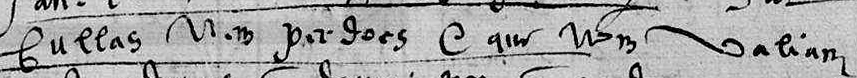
bullas nem perdoes e que nom valiam
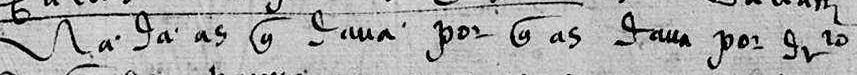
Nada as q̅ daua porq̅ as daua por drro
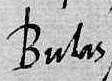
Bulas
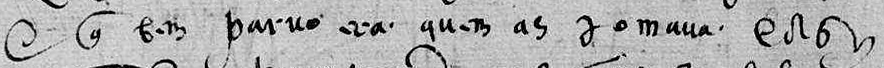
e q̄ bem paruo era quem as tomaua e Asy
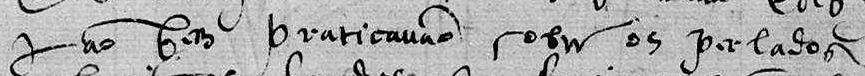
tão bem praticauão sobre os perlados
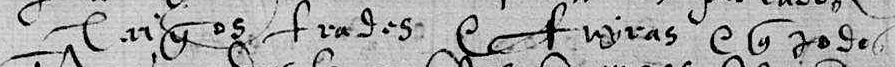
Clerigos frades e freyras e q̅ todos
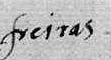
freiras
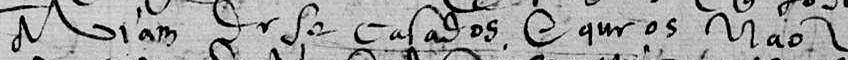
Aviam de ser casados e que os Naõ
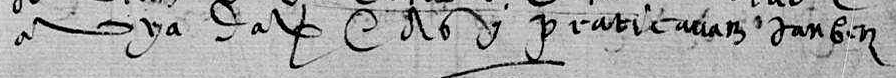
avya daꝟ e Asy praticauam tanben
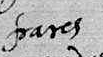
frares
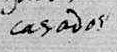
casados
